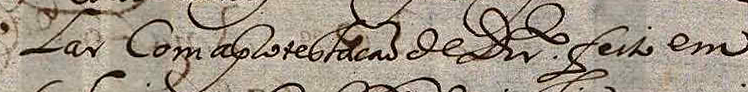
Lar Com a pRotestaçaõ de Dir.to feito em
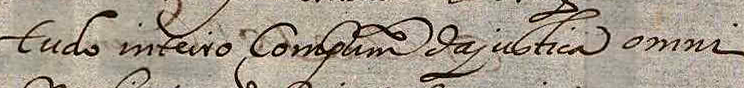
tudo inteiro CompRim.to da justiça omni
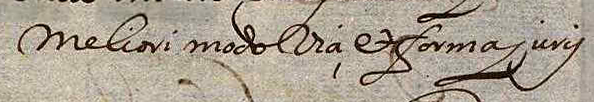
meliori modo Via, ē forma juris
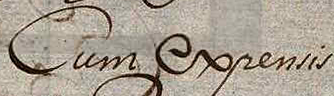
Cum expensis
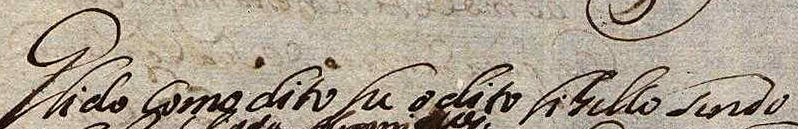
E lido como dito he o dito libello sendo
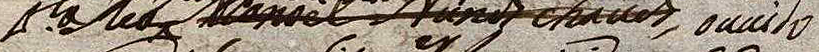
p.la Rea Manoel Nunes chaues, ouuido
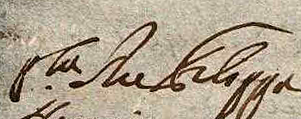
p.la Ree Felippa
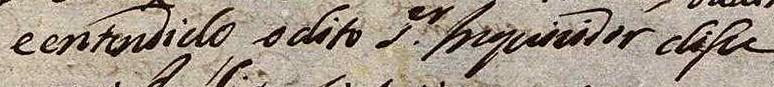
e entendido o dito s.or Inquizidor disse
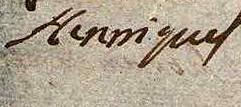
Henrriques
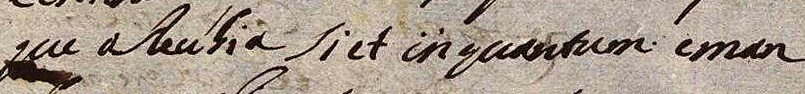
que a Recebia si et in quantum. e man
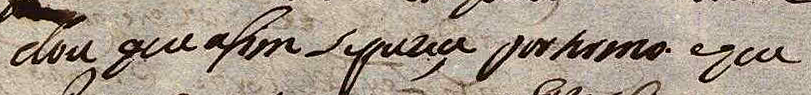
dou que assim se puzece por termo. e que
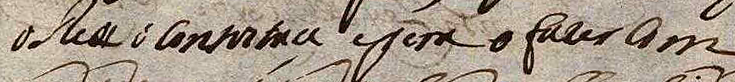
o Reo o contestou, e pera o fazer com
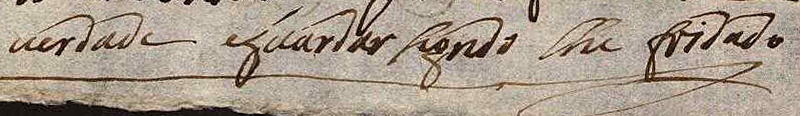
uerdade e guardar segredo lhe foi dado
